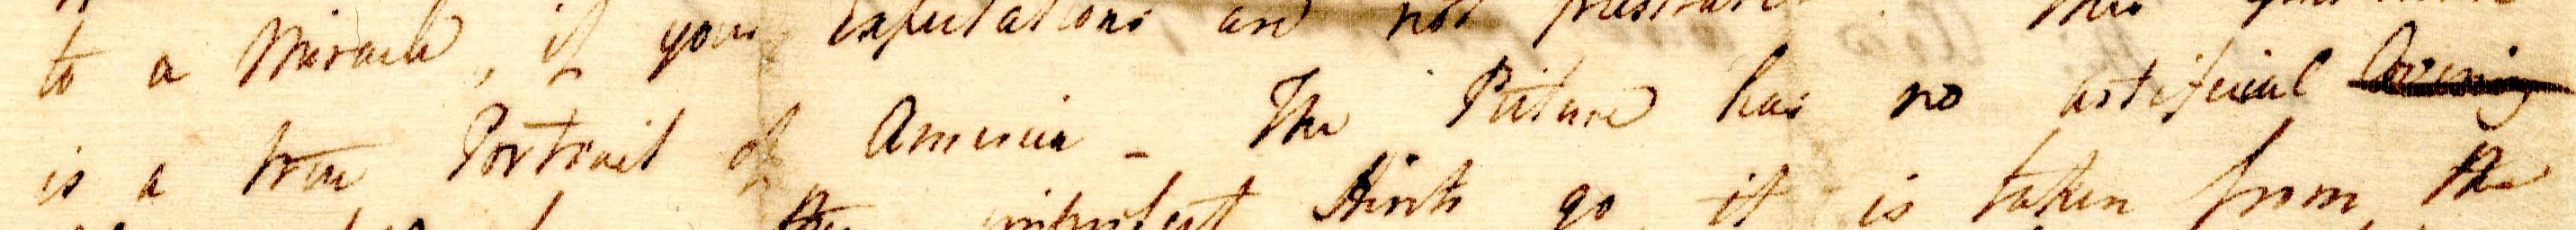is a true Portrait America. The Picture has no artificial [____]
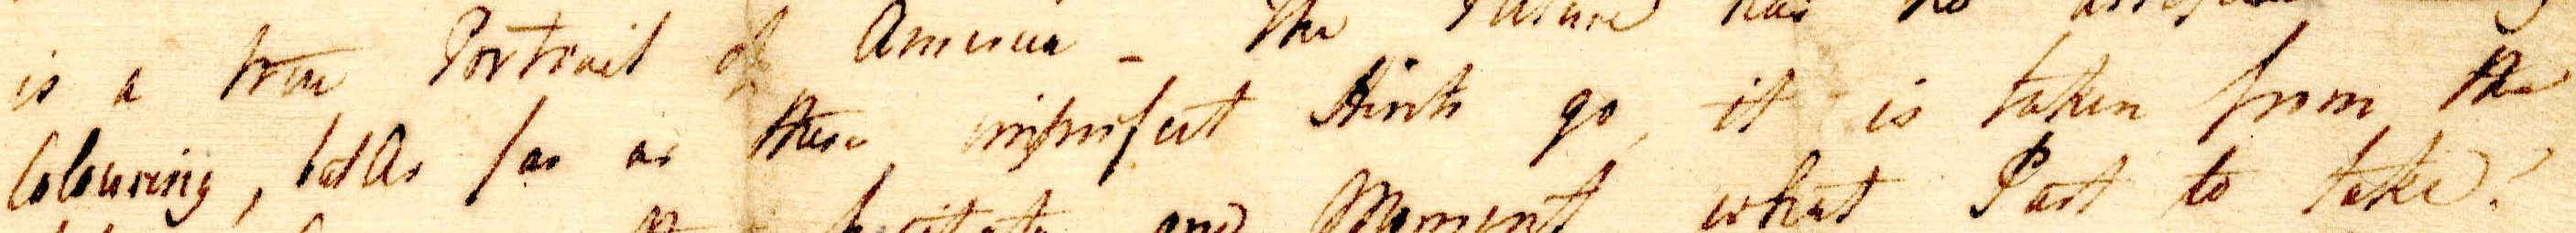Colouring, but As far as these imperfect Hints go, it is taken from the
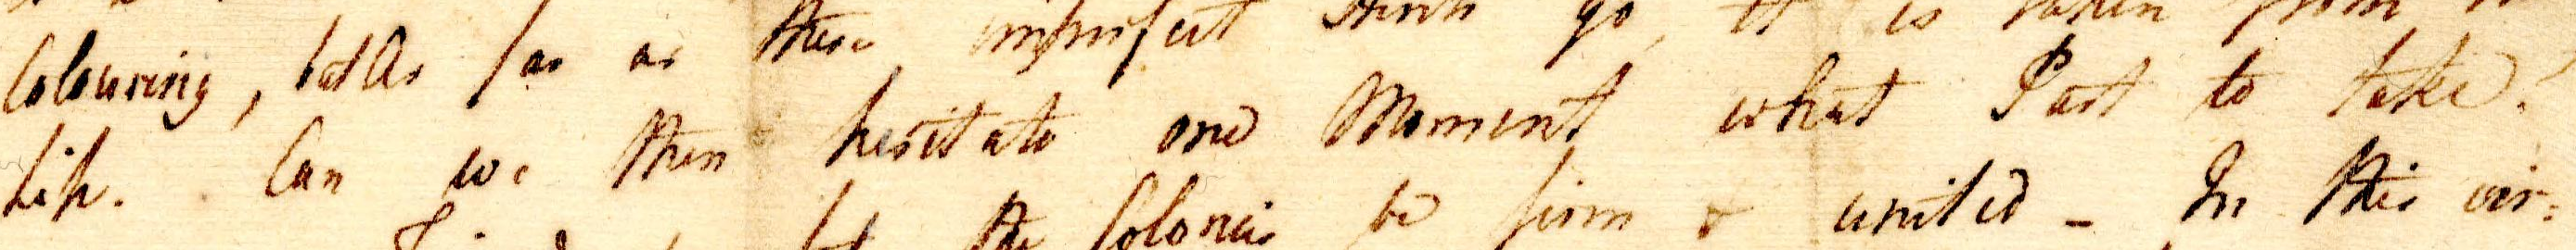Lip. Can we then hesitate one Moment what Part to take?
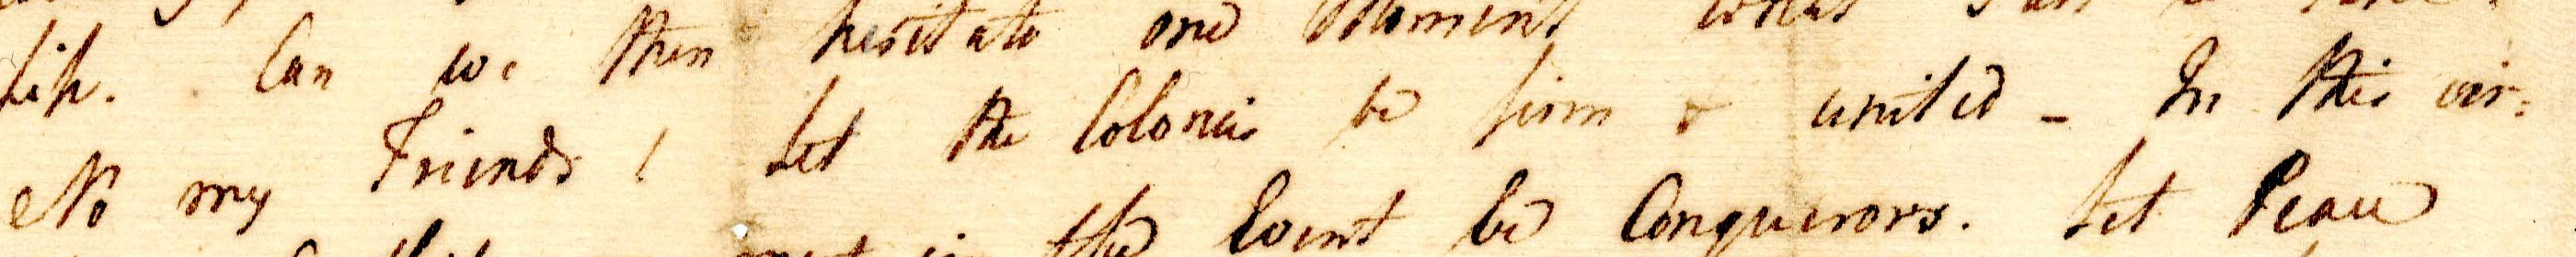No my Friends! Let the Colonies be firm & united. In this vir-
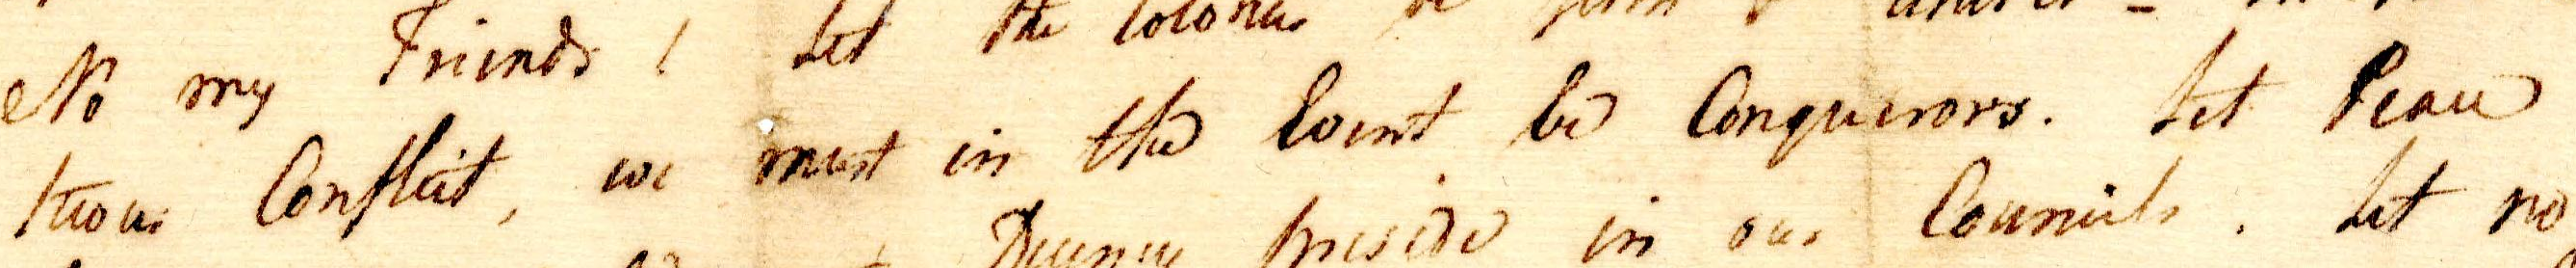-tuous Conflict, we must in the Event be Conquerors. Let Peace
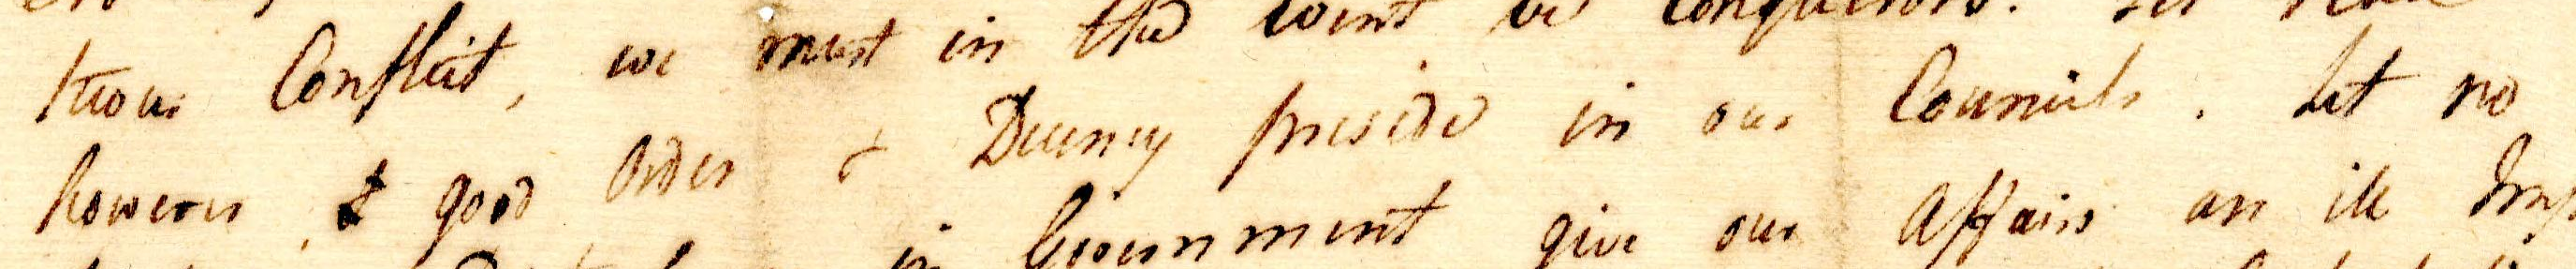Power us & good Order & Decency preside in our Councils. Let no
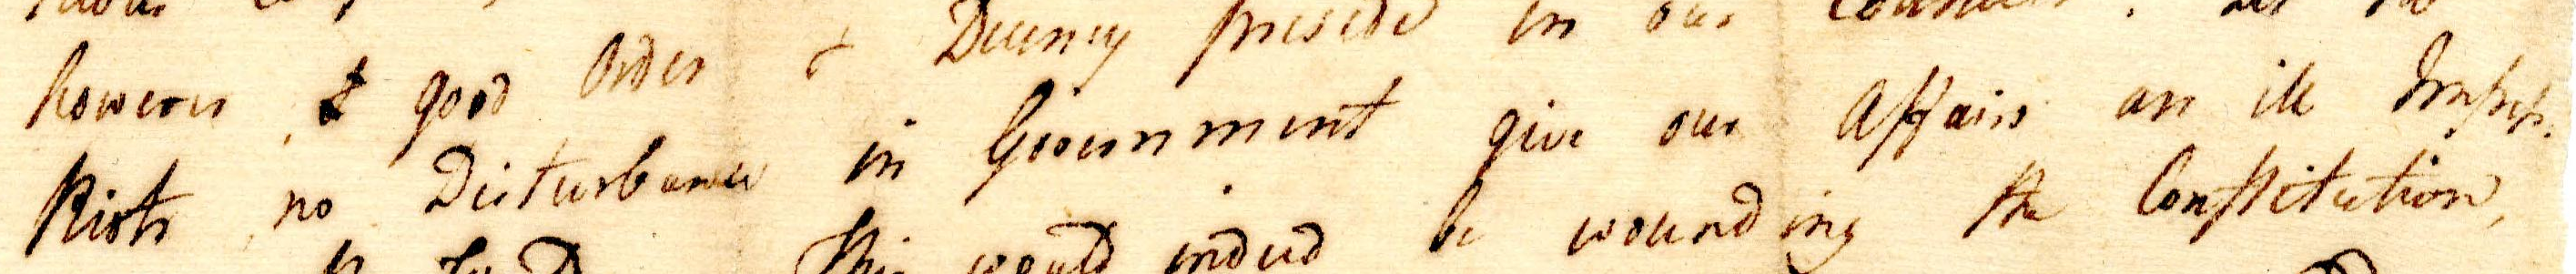Riots no Disturbances in Government give our affairs are ill Impress-
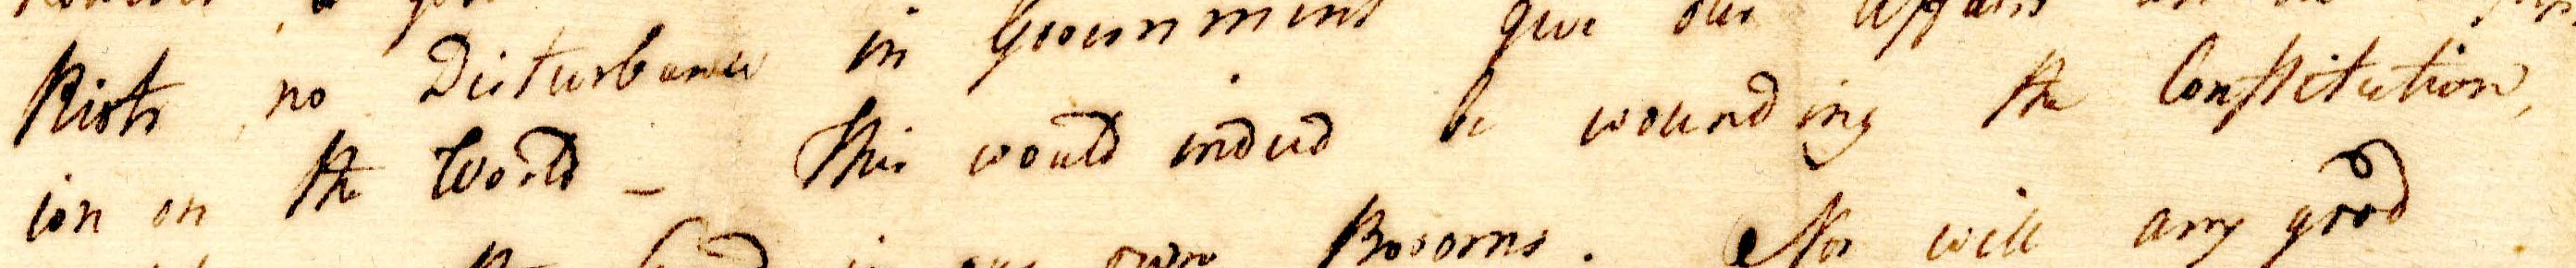-ion on the World. This would indeed be wounding the Constitution
